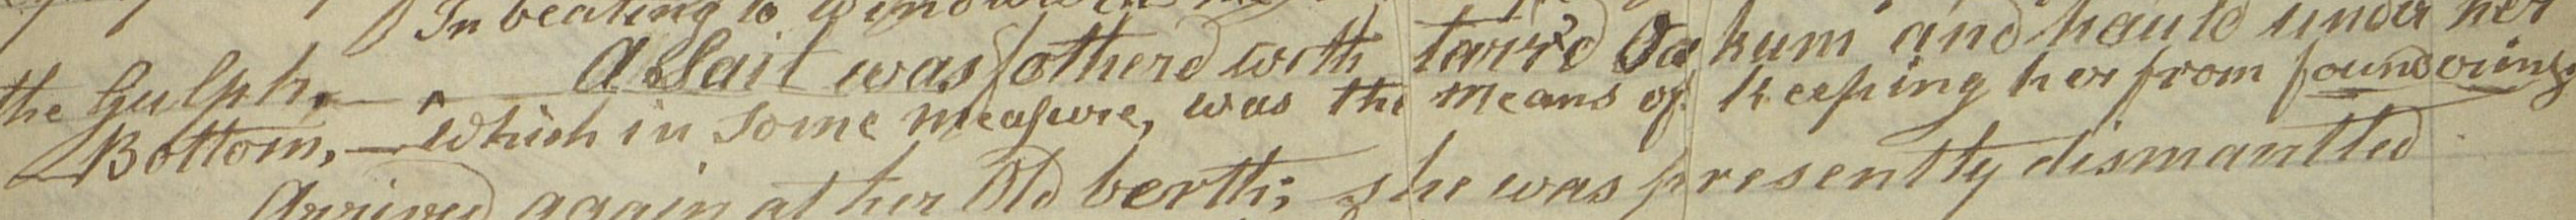Bottom, Which in some Measure was the means of keeping her from foundering
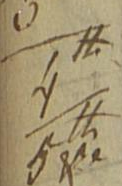4^th
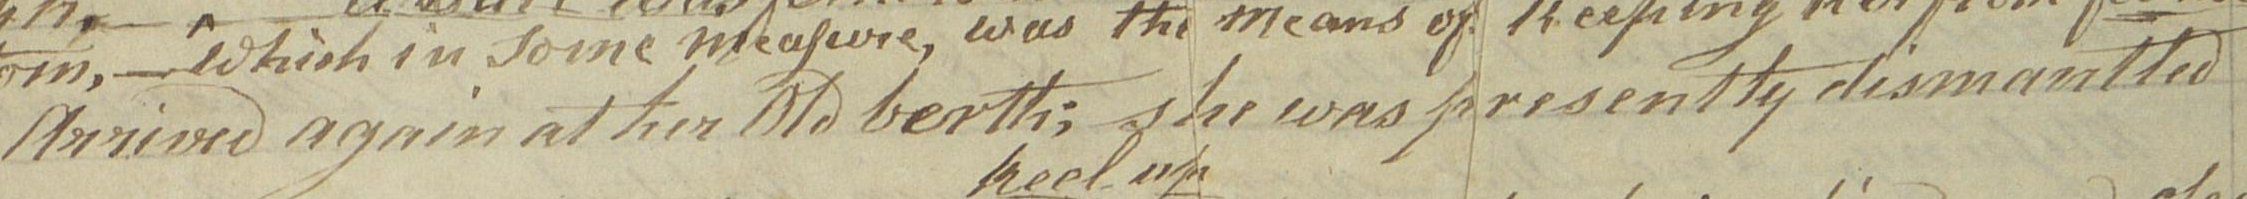Arrived again at her Old berth; she was presently dismantled
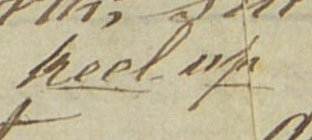keel up
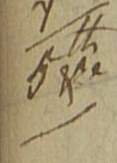5^th
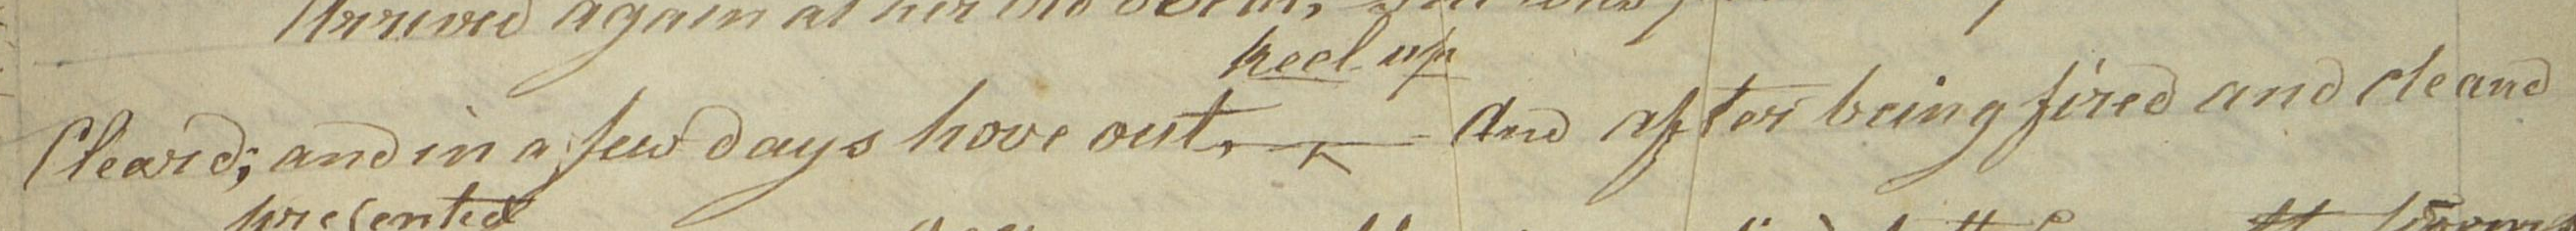Cleard, and in a few days hove out, ^ And after being fired and cleand
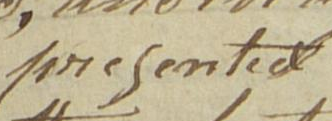presented
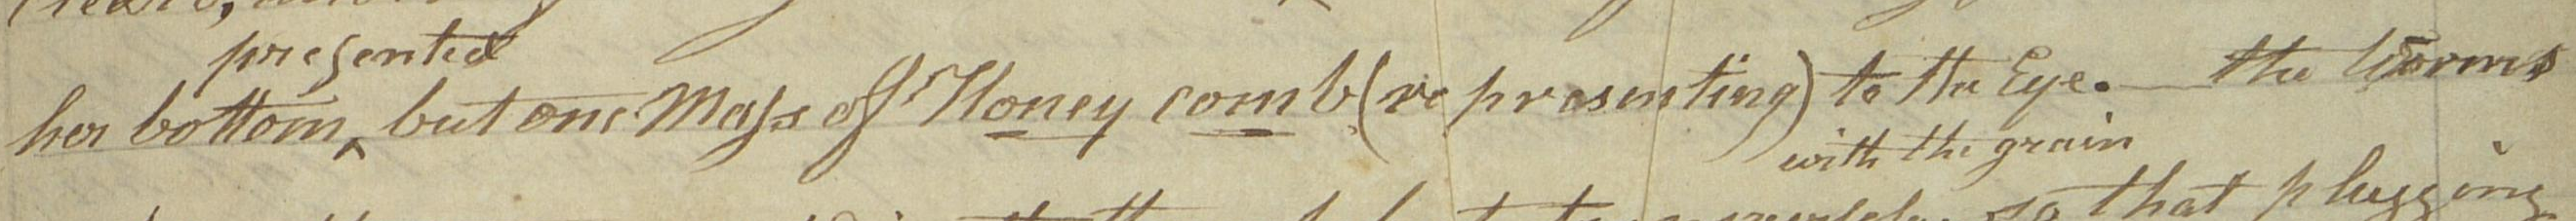her bottom ^ but one Mass of Honey comb (representing) to the Eye. The Worms
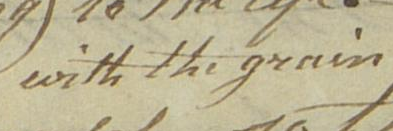with the grain
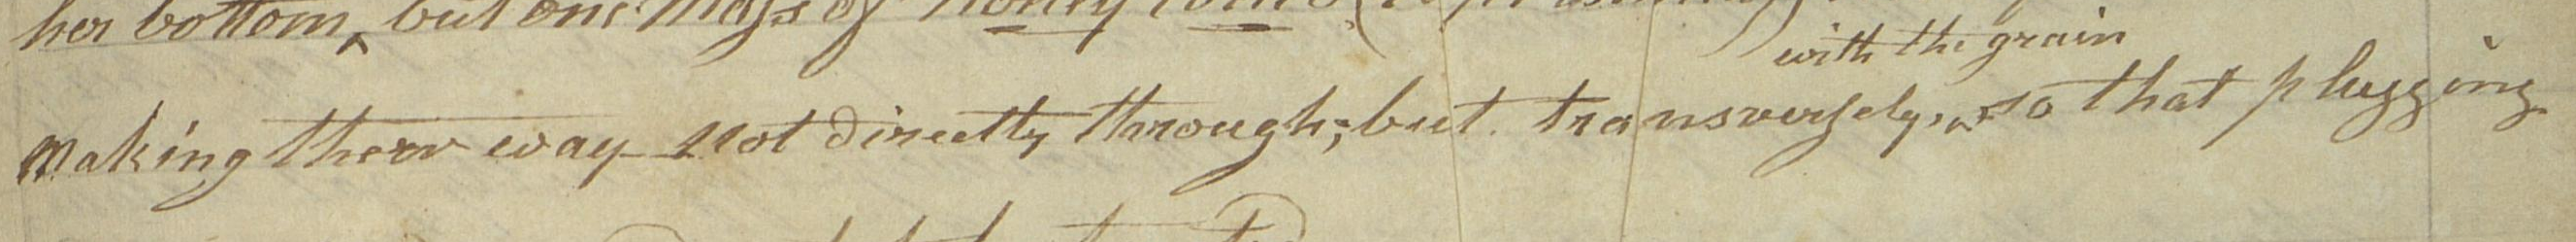making their way not directly through; but transversely ^ so that plugging
